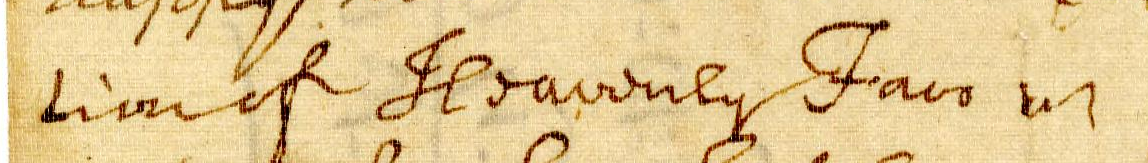tion of Heavenly Favour
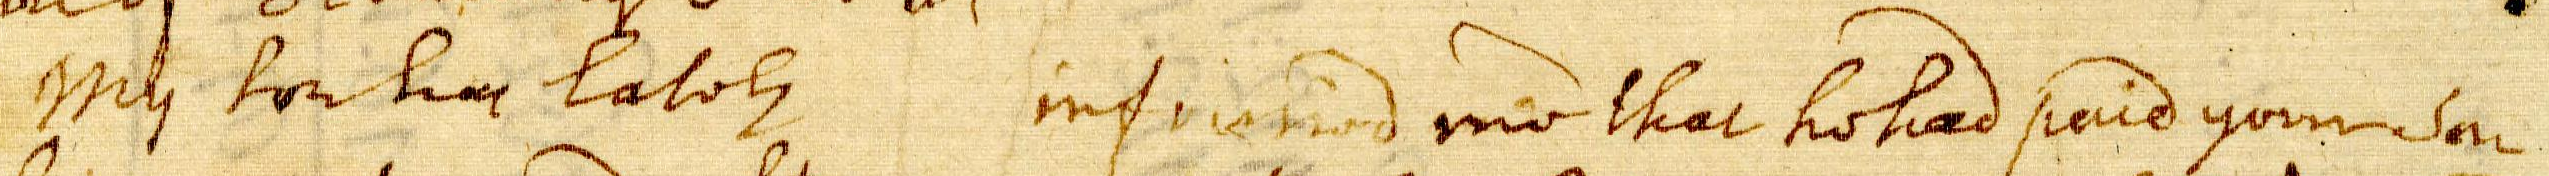My Son has lately informed me that he had paid your Son
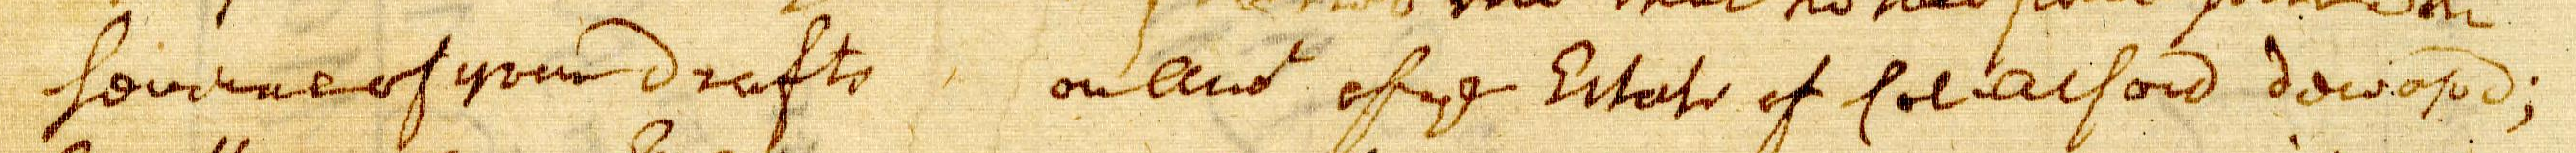several of your drafts on Acco^t of y^e Estate of Col Alford developed;
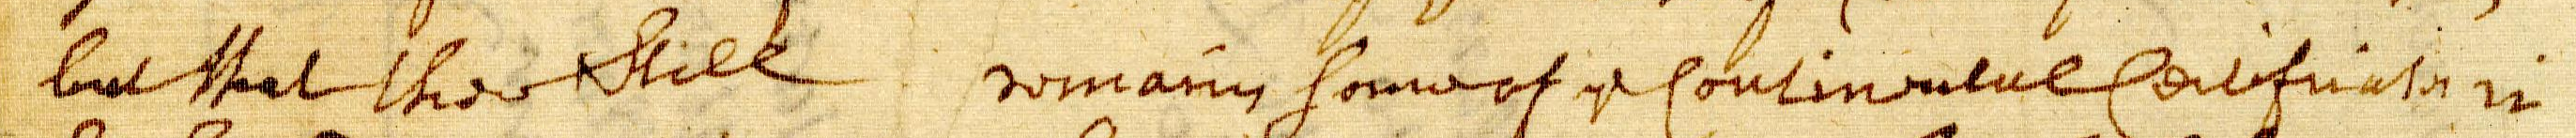but that there Still remains some of y^e Continental Certificates in
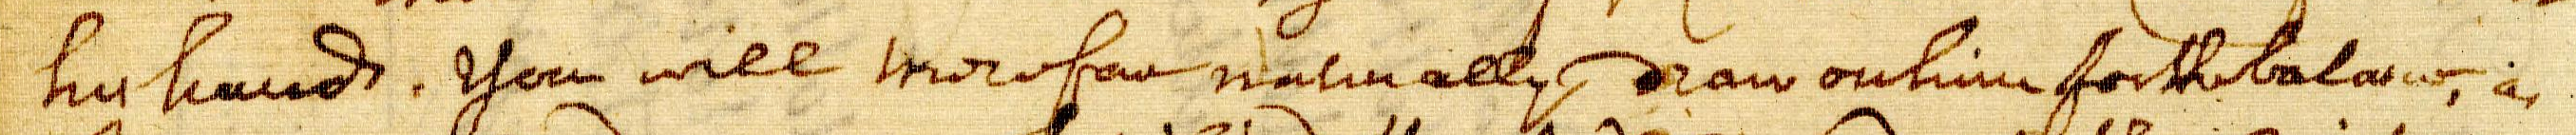his hands. You will therefore make all y^e [d]raw outline for the balance, a,
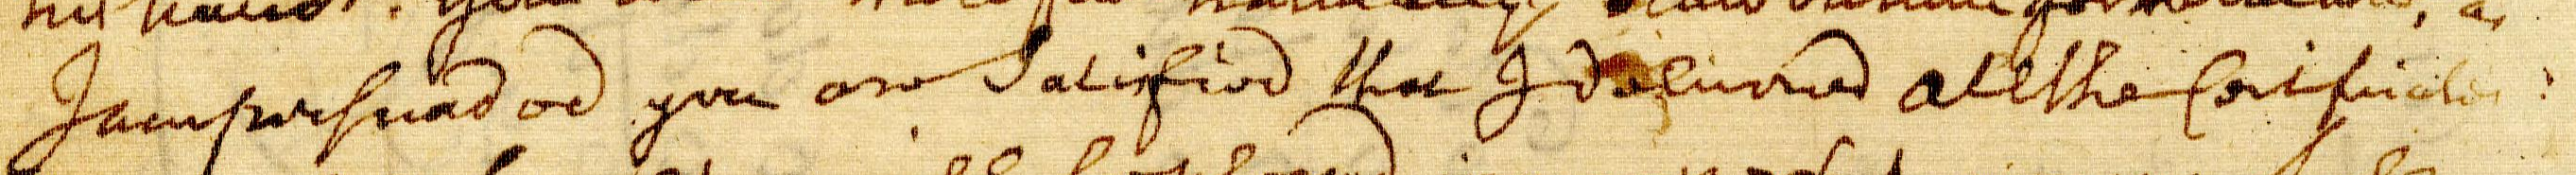I am persuaded you are Satisfied that I delivered all the Certificates
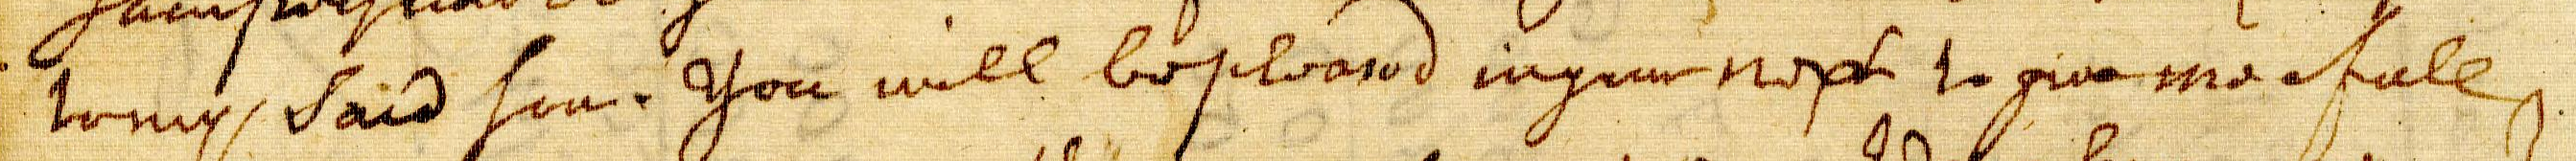to my Said Son + You will be pleas'd in your next to give me a full
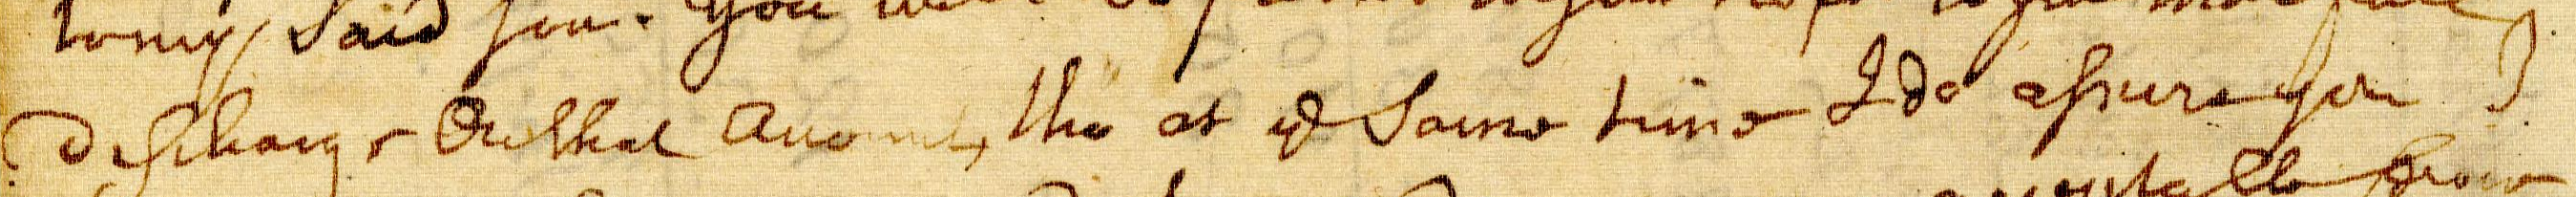discharge On that Account, tho at y^e Same time I do assure you I
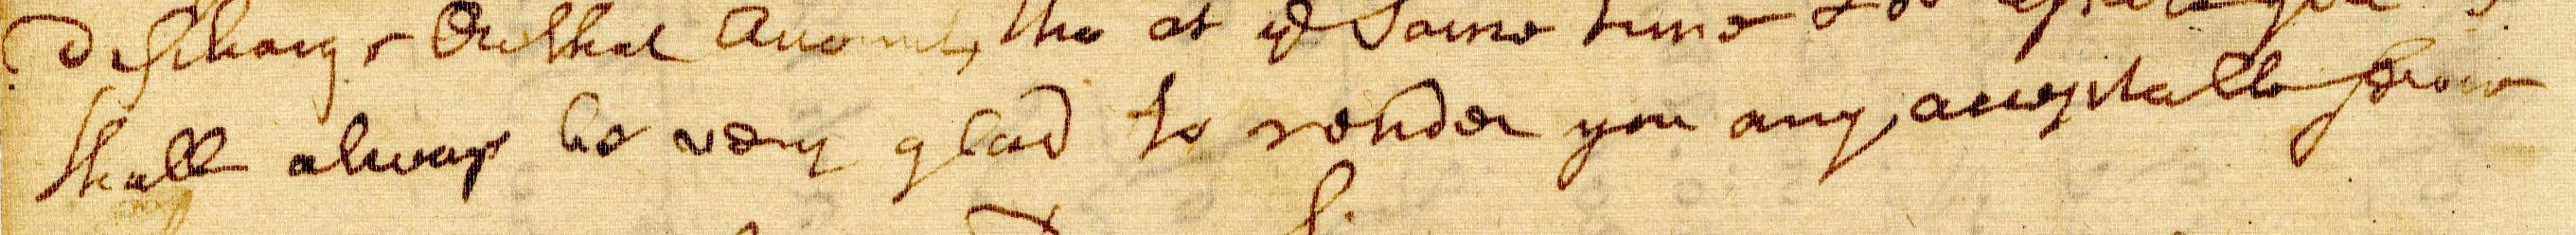that always be very glad to render you any acceptable {price}
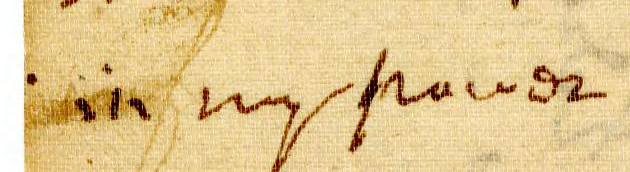in my power
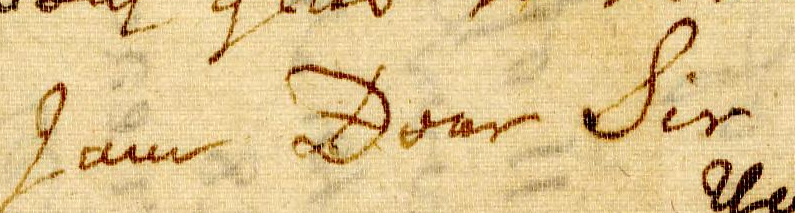I am Dear Sir
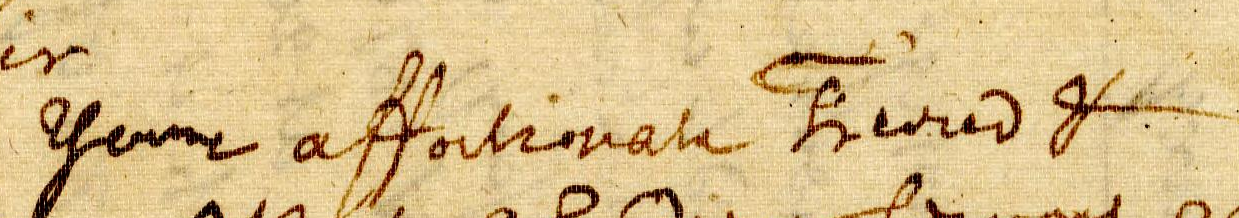Your affectionate Friend &
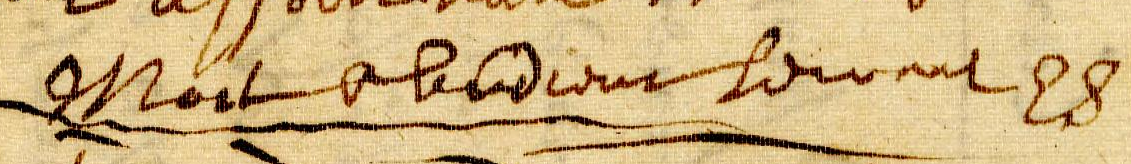Most & obedient Servant ES
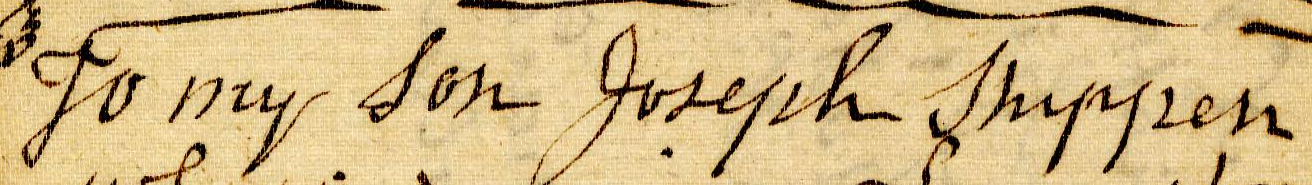To my Son Joseph Shippen
